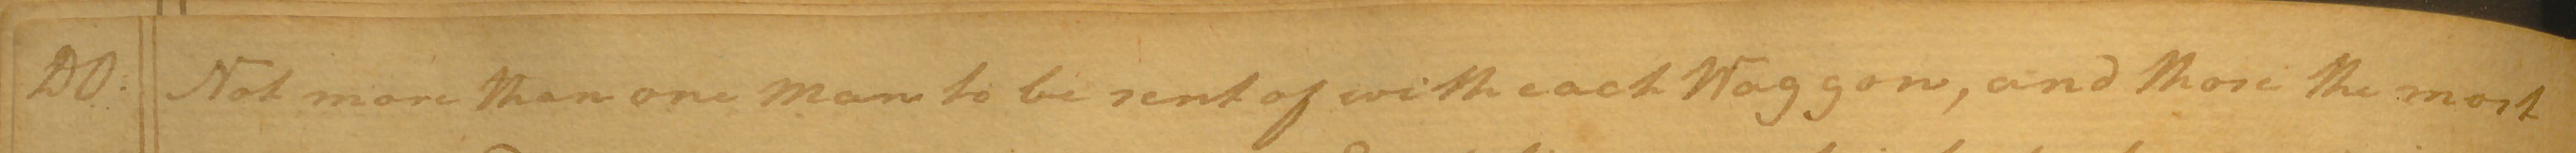DO. Not more than one man to be sent of with each Waggon, and those the most
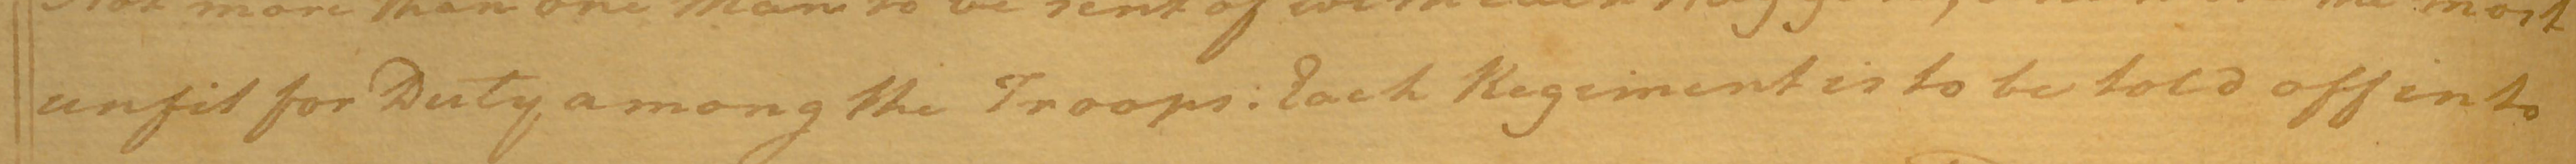unfit for Duty among the Troops: Each Regiment is to be sold off into
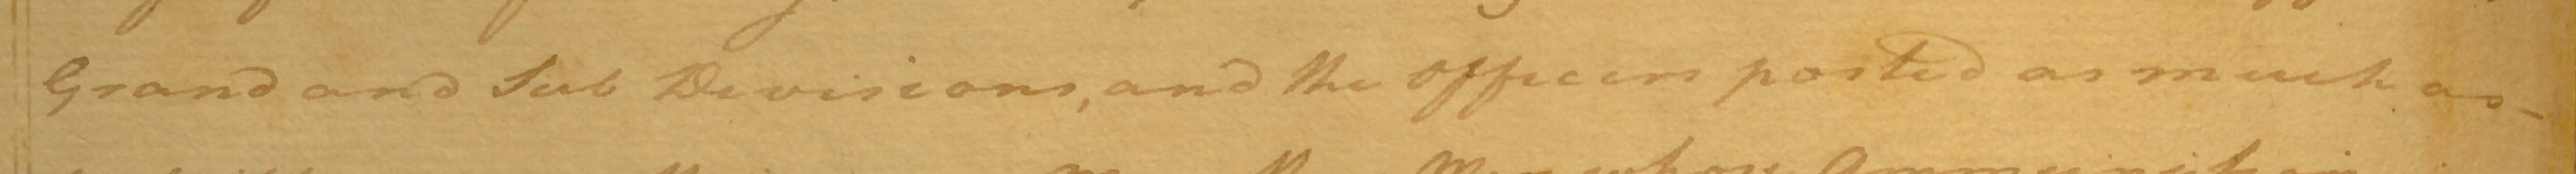Grand and Sub Divisions, and the officers posted as much as
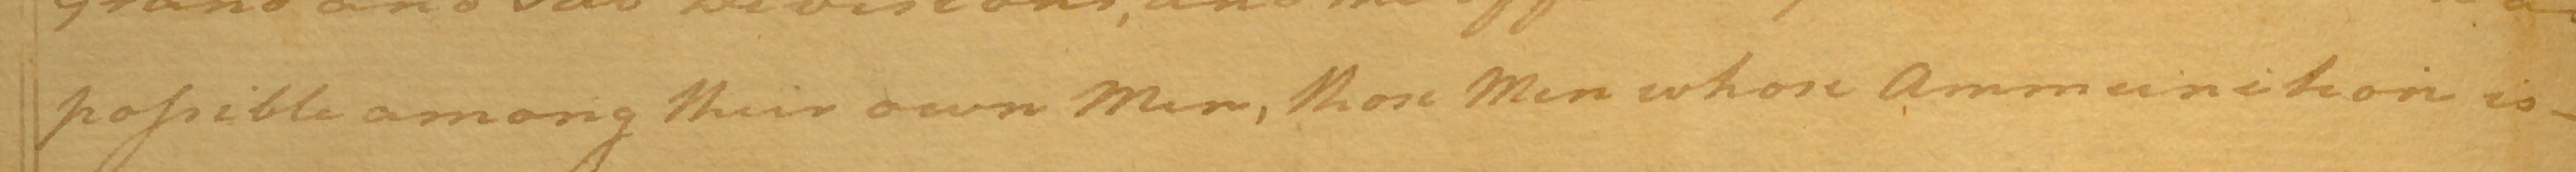possible among their own Men, those Men whose Ammunition is-
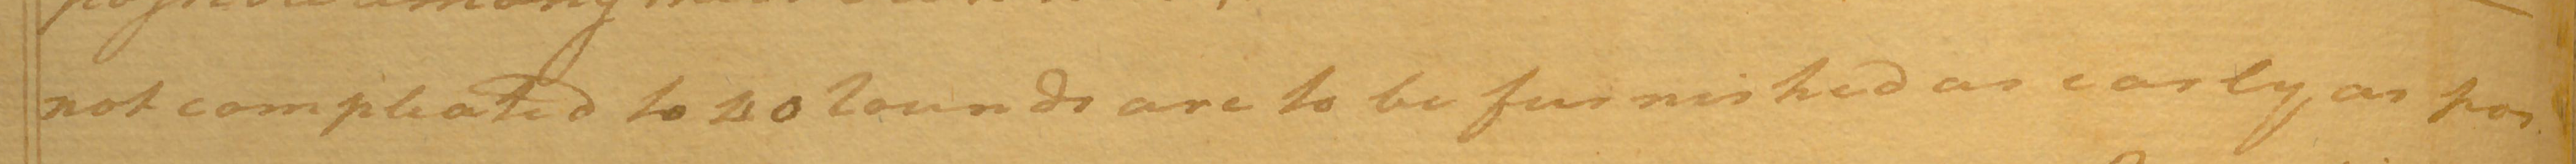not compleated to 40 rounds are to be furnished as early as pos
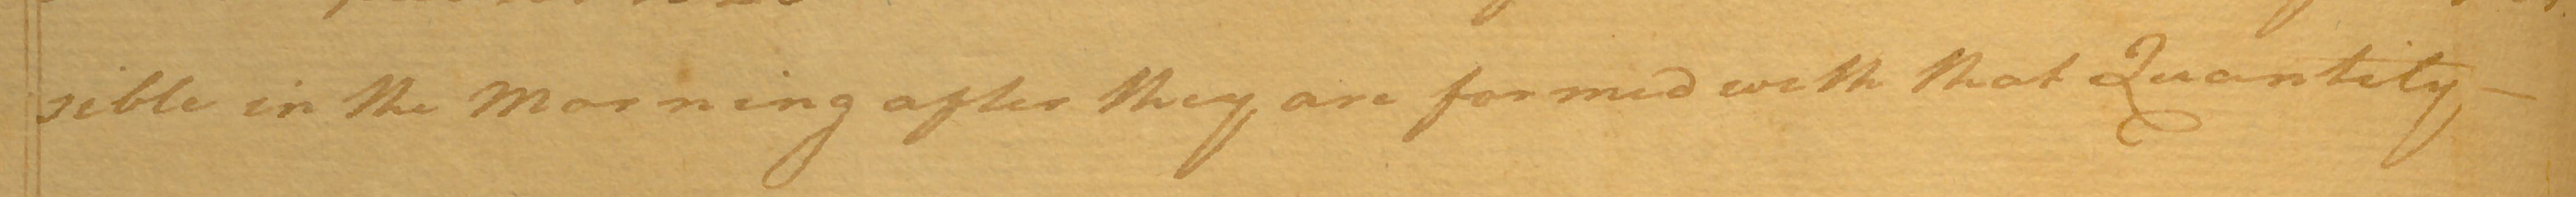sible in the Morning after they are formed with that Quantity-
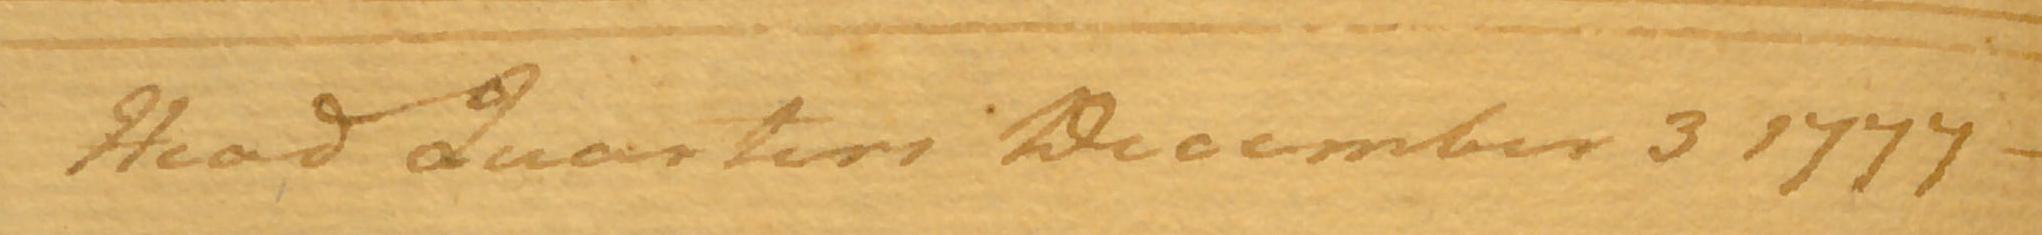Head Quarters December 3 1777-
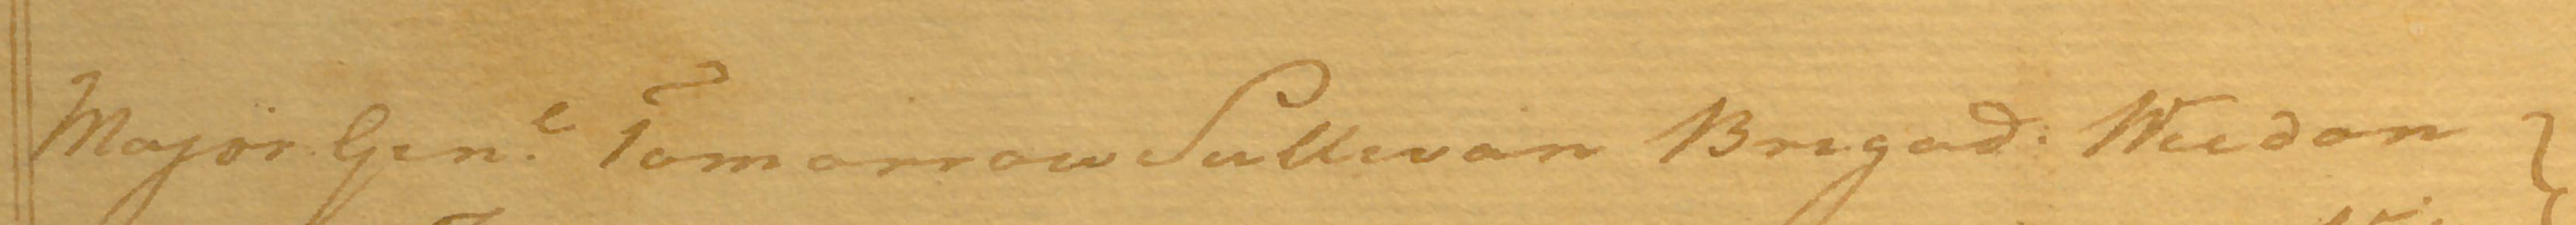Major Gen^l. Tomorrow Sullivan Brigad. Weedon
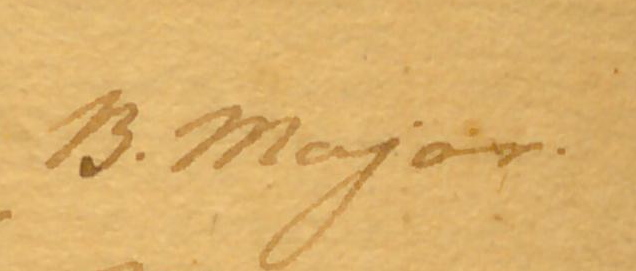B. Major.
